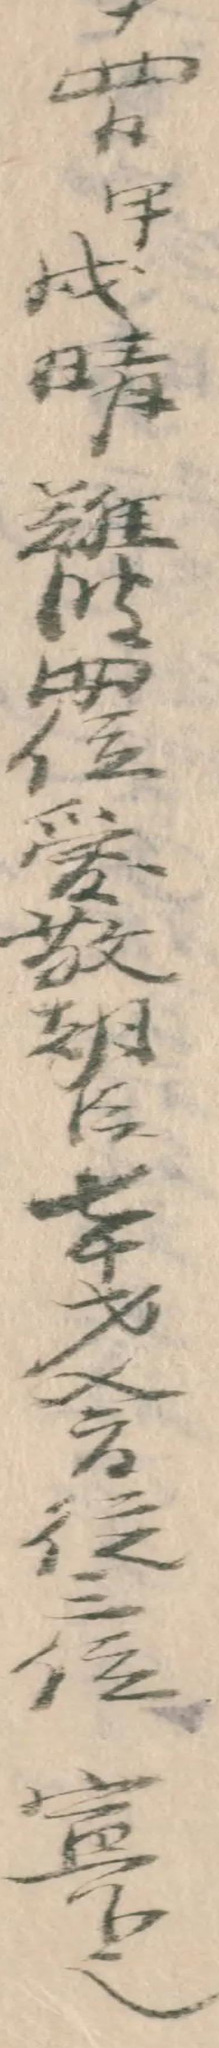十四日甲戌晴難波四位愛敬朝臣七十才今日従三位宣下也
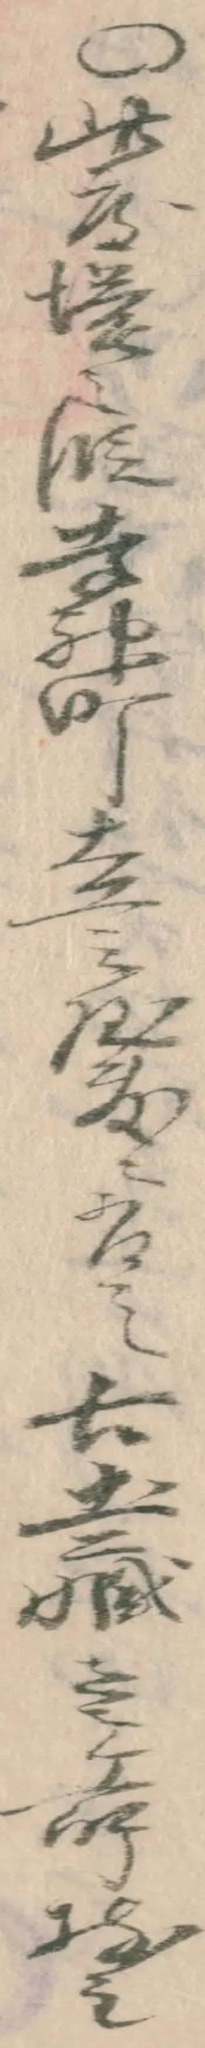〇此度堤之段寺神町在之屋敷ニ有之右土蔵壱ヶ所持之
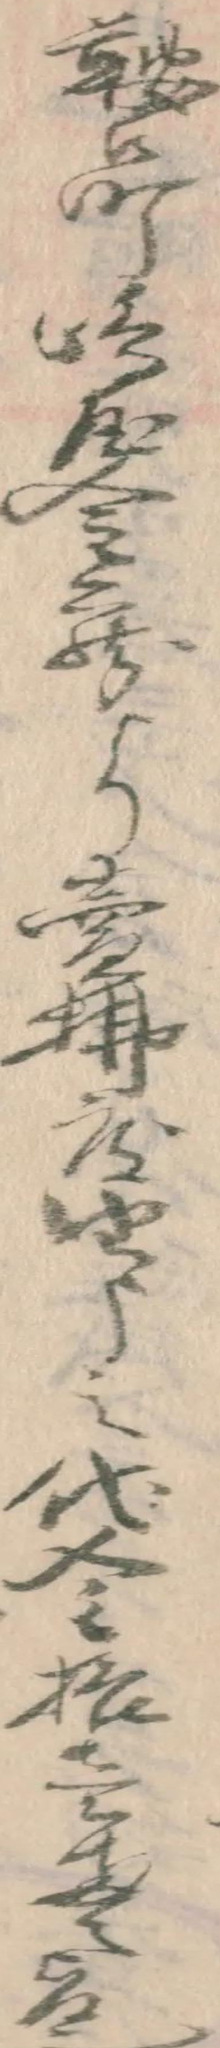鞍候町嶋屋金蔵より売払度由申之代金拾壱貫目也
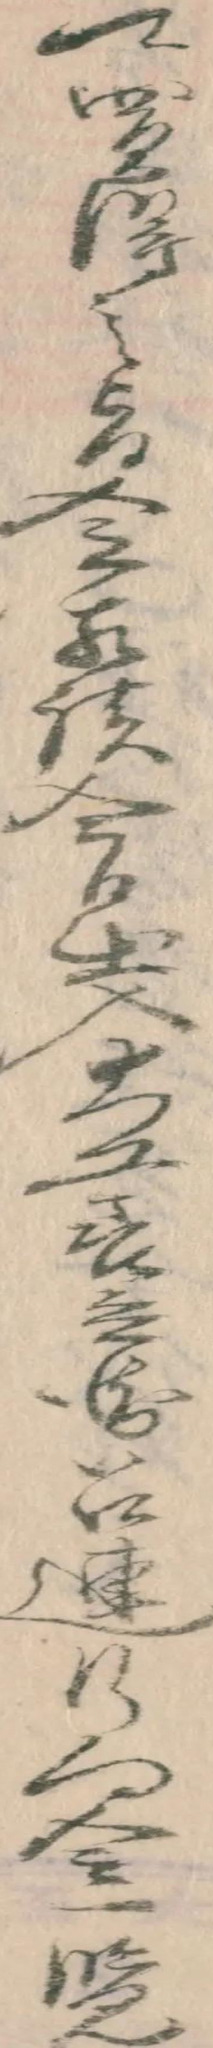可買得之旨金相談今日出入大工善兵衛召連行向令一覧
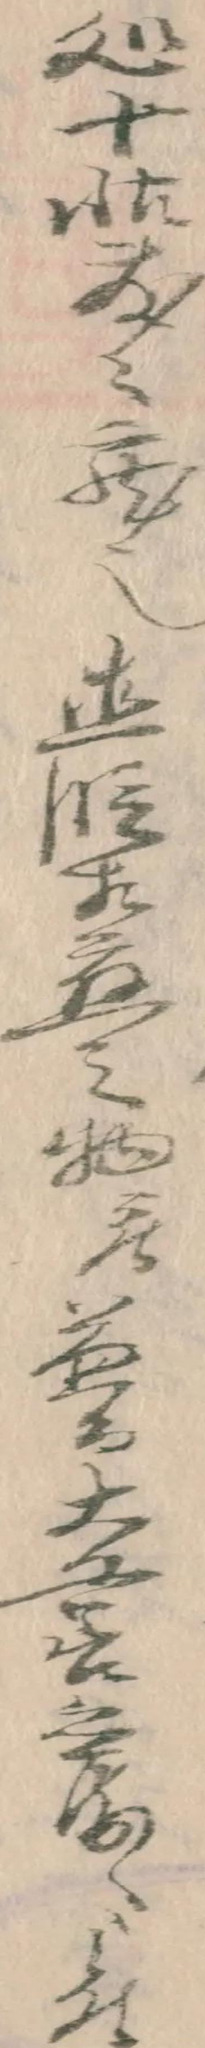処十帖敷之蔵也直段相應之物ニ付兼而大工善兵衛へ申付
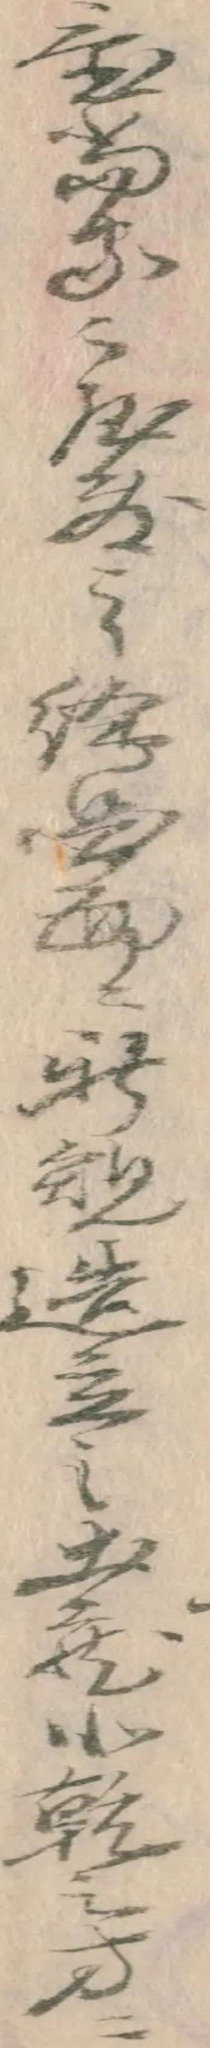置當家屋敷之絵図面に新規造立之土蔵北乾之方に
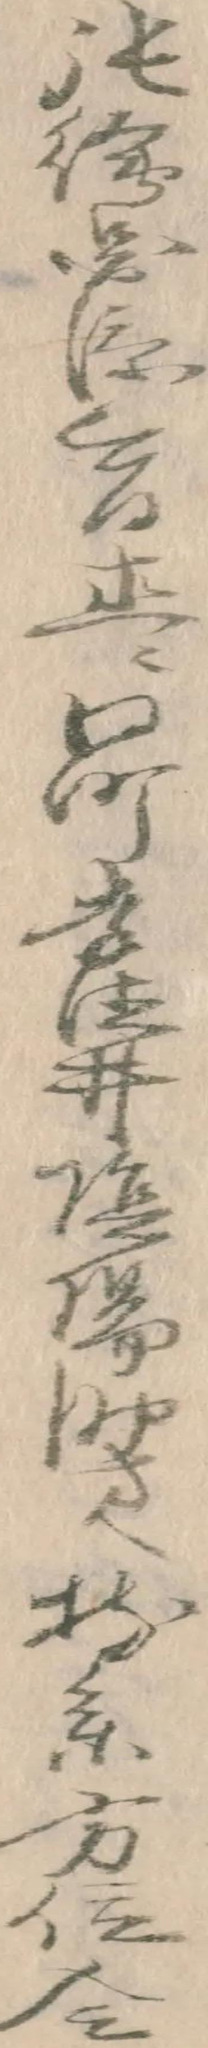張絵図添今日直ニ同町幸徳井陰陽助方へ持参方位金
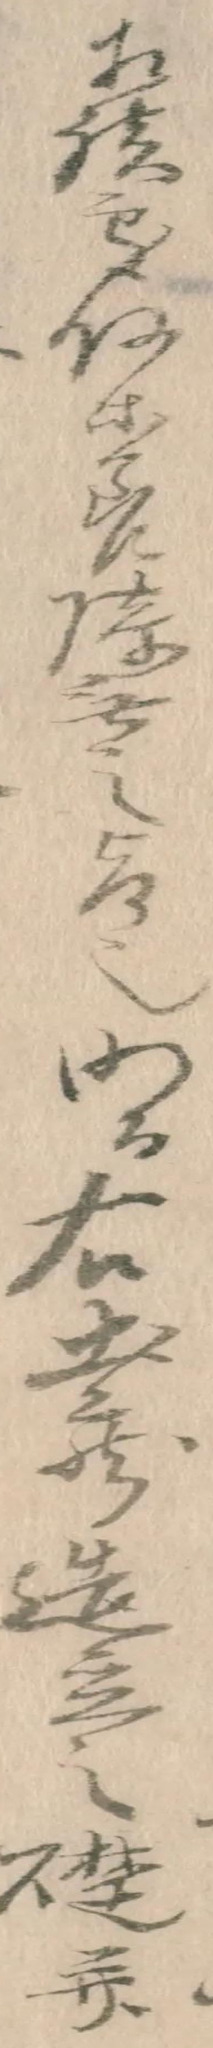相談處何等差障無之旨也仍而右土蔵造立之礎并
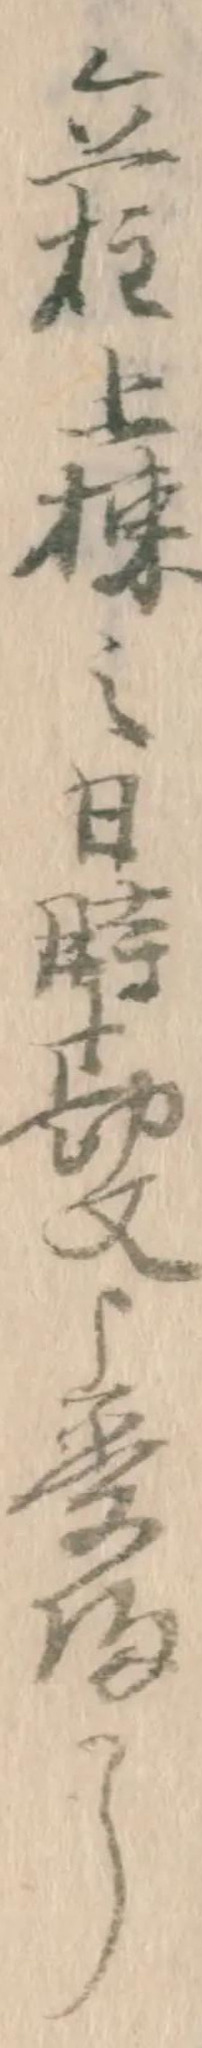立柱上棟之日時勘文申受帰了
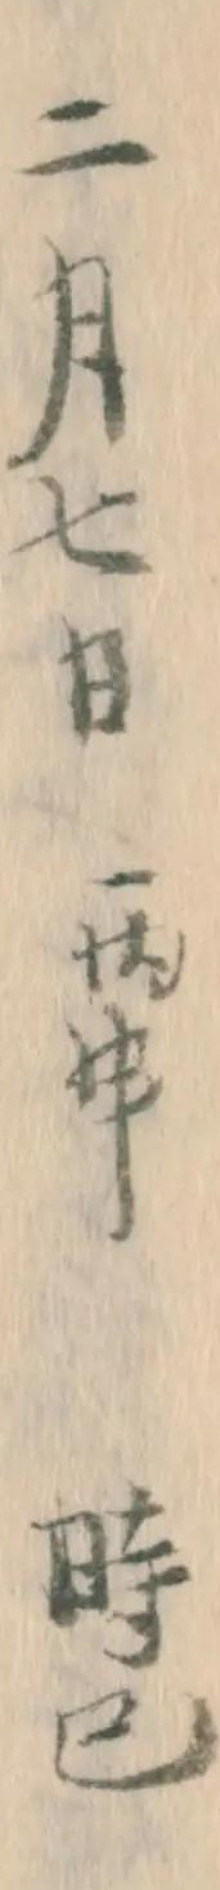二月七日丙申時巳
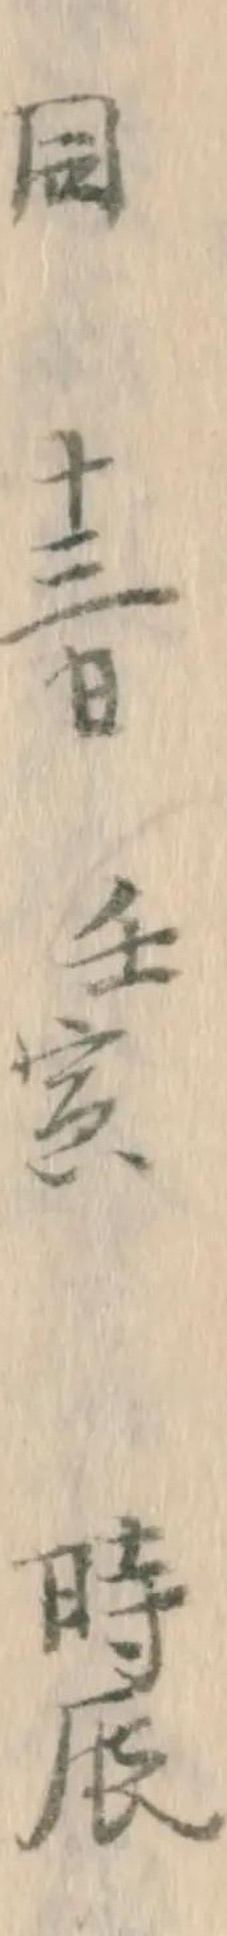同十三日壬寅時辰
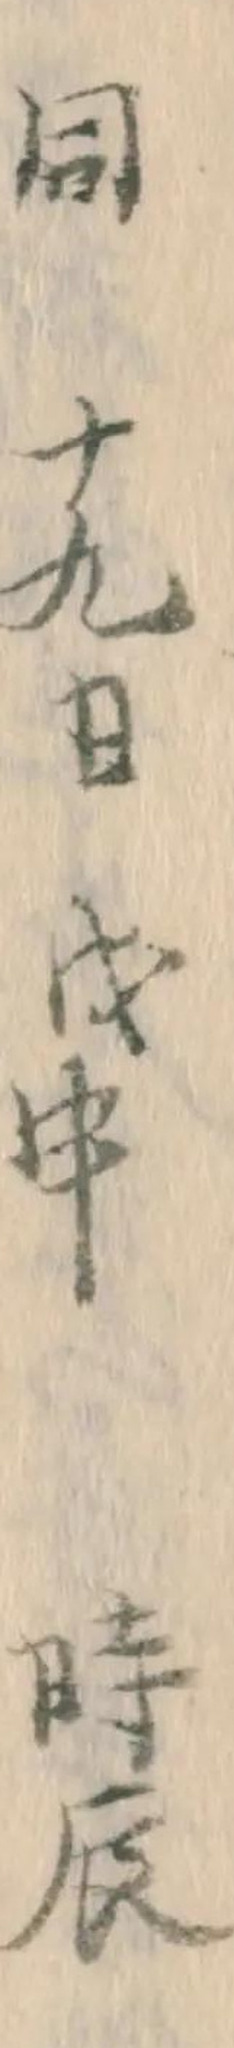同十九日戊申時辰
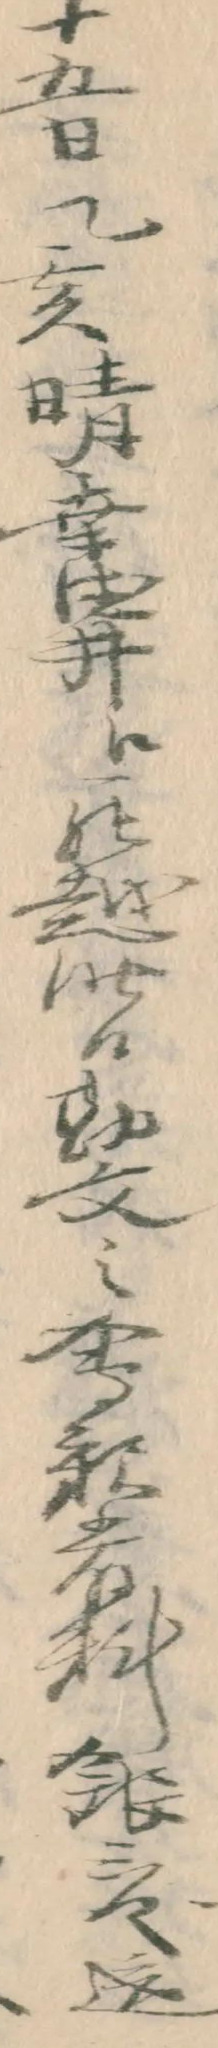十五日乙亥晴幸徳井え罷越昨日勘文之會釈肴料銀三匁送
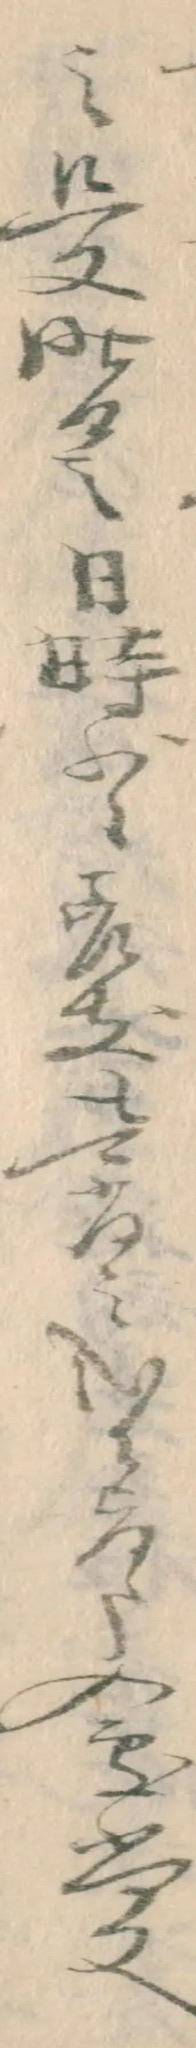之且又昨日之日時少々差支も可有之哉之旨申入處尚又
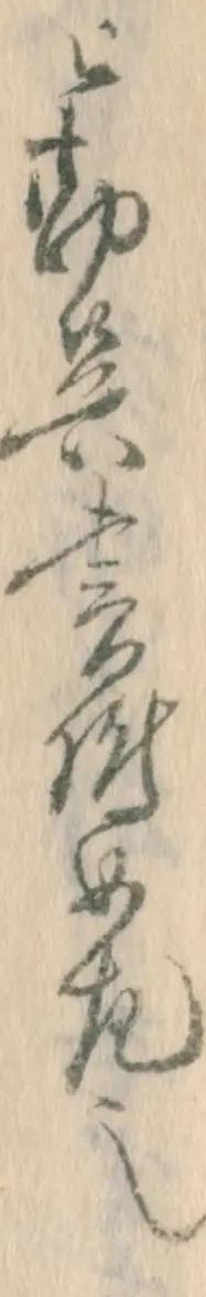被勘呉書附如左也
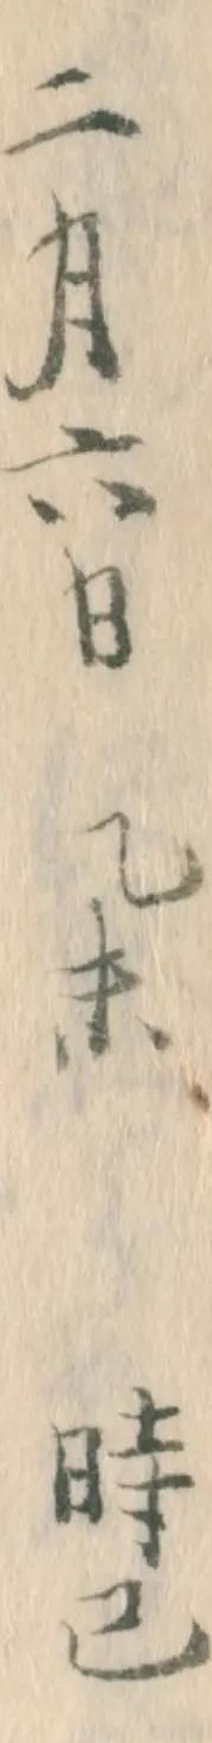二月六日乙未時已
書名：賀茂社記録. 第67冊
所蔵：国立国会図書館 National Diet Library, JAPAN
